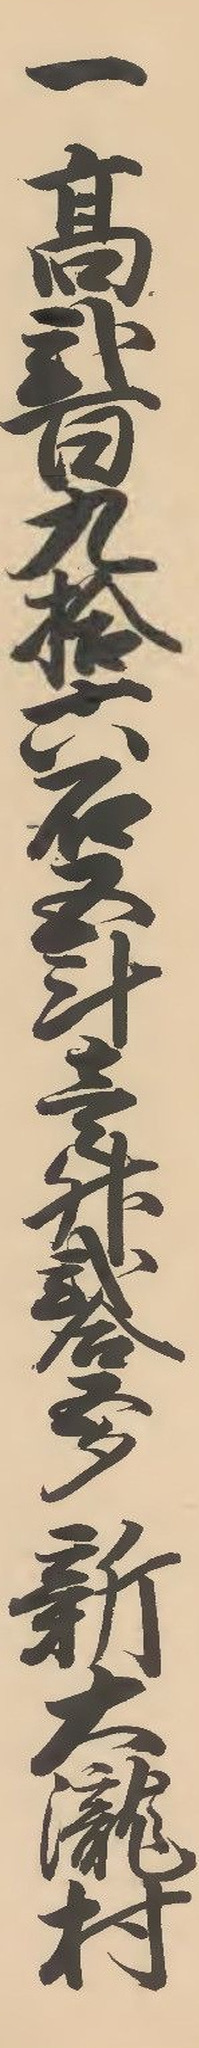一高弐百九拾六石五斗壱升弐合五勺新大瀧村
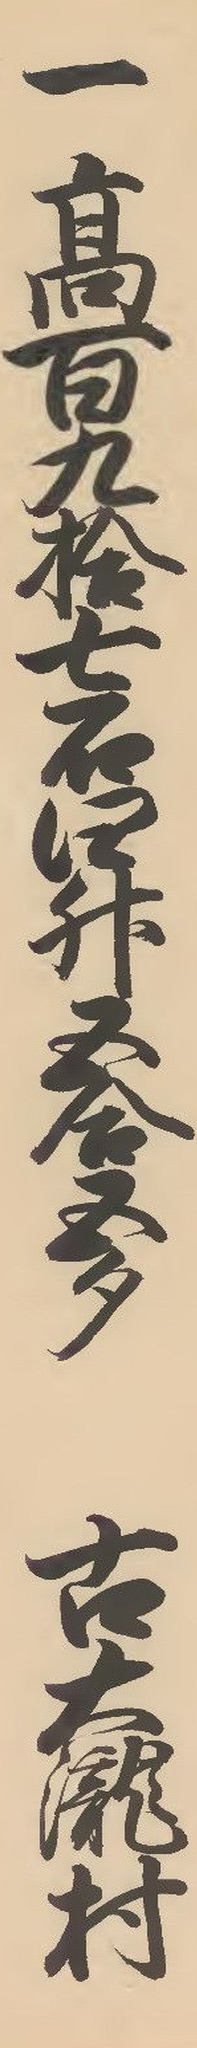一高百九拾七石四升五合五勺古大瀧村

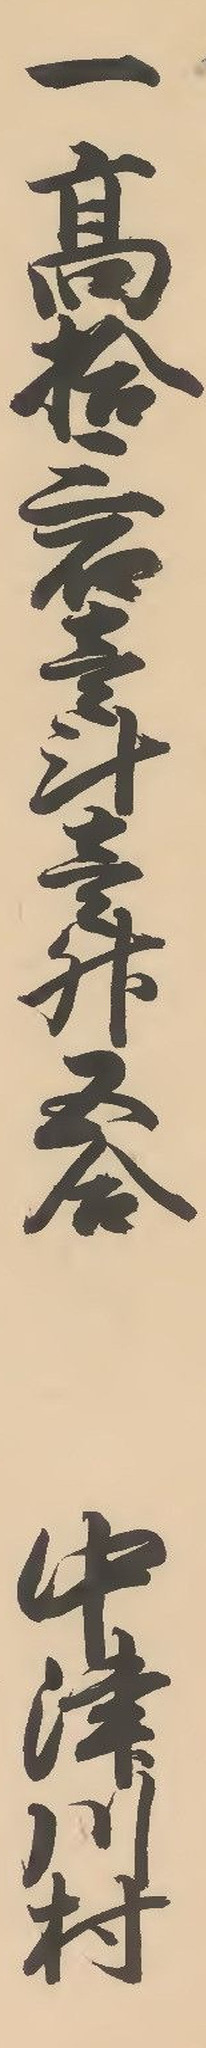一高拾三石壱斗壱升五合中津川村
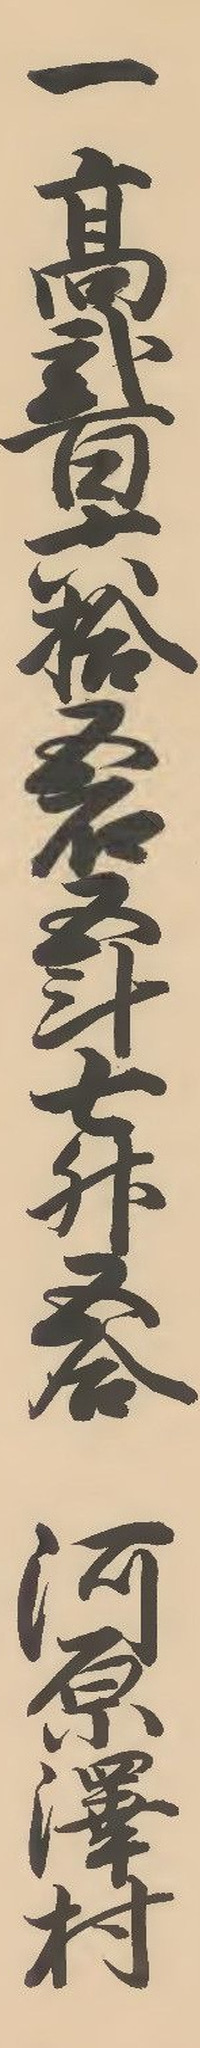一高弐百六拾五石五斗七升五合河原澤村
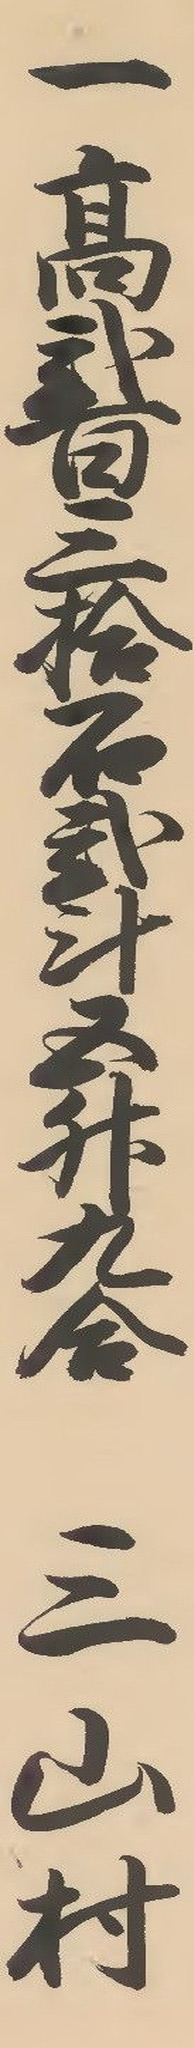一高弐百三拾石弐斗五升九合三山村
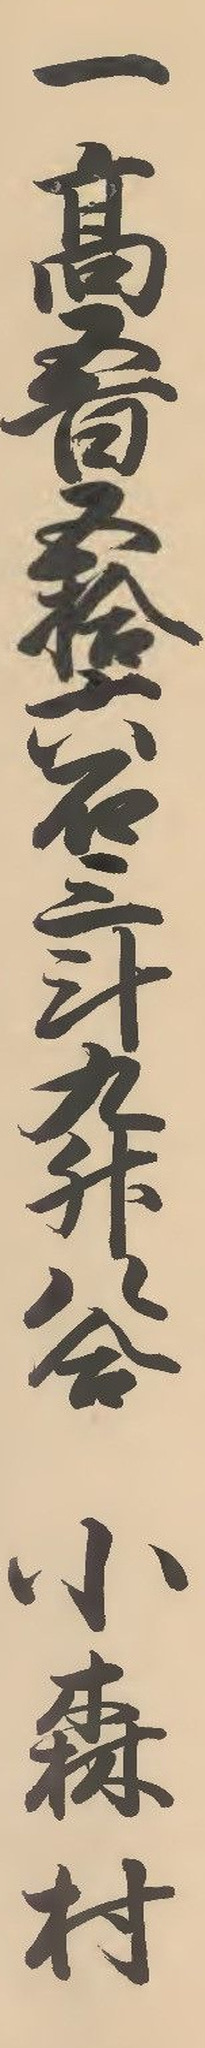一高五百五拾六石三斗九升八合小森村
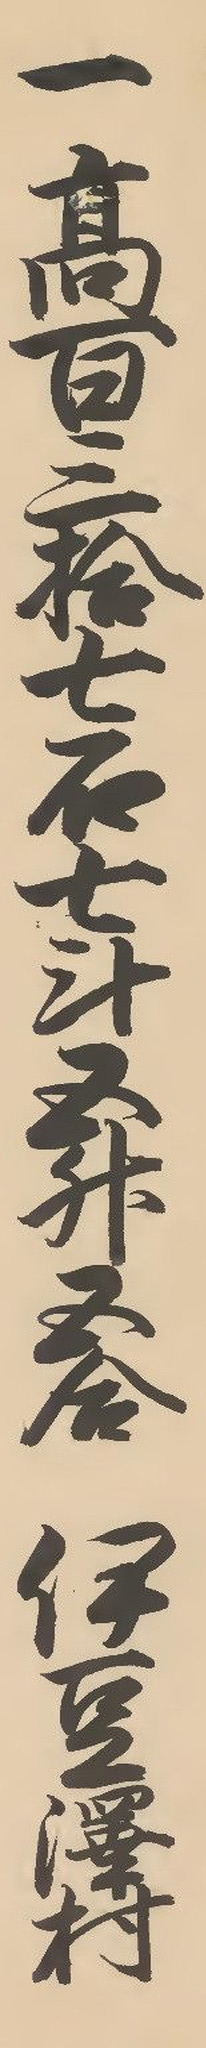一高百三拾七石七斗五升五合伊豆澤村
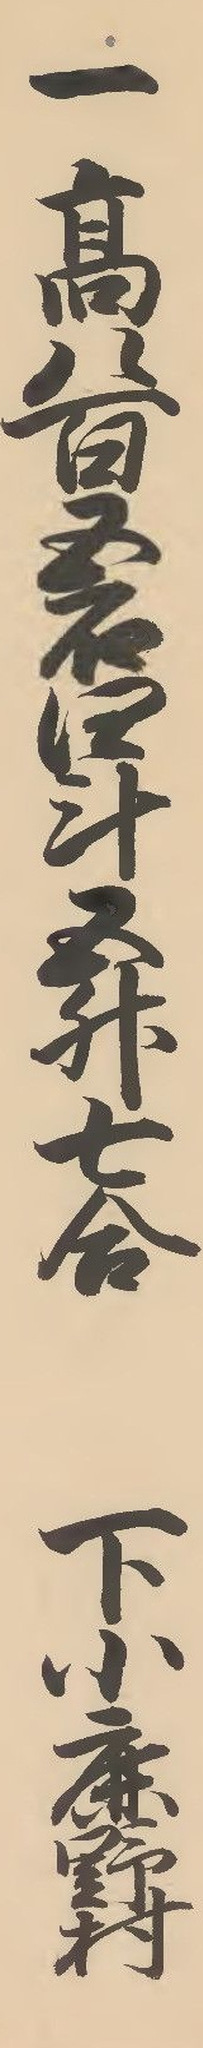一高八百五石四斗五升七合下小鹿野村
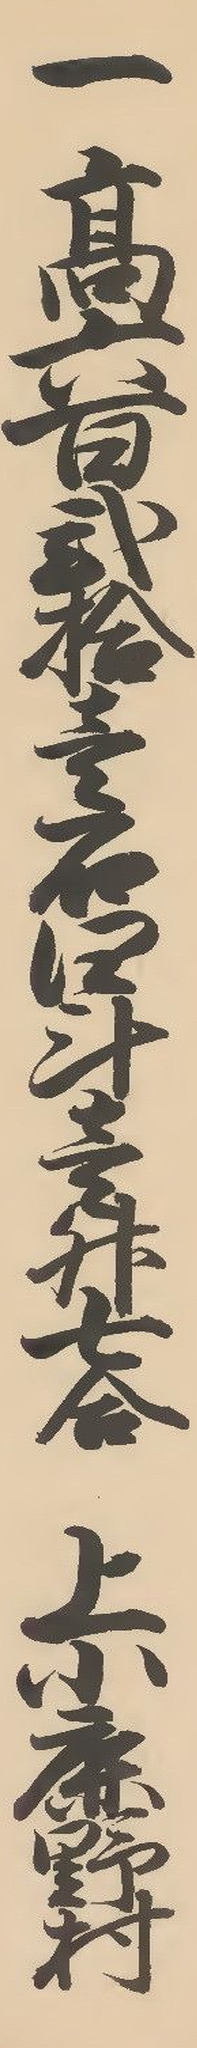一高六百弐拾壱石四斗壱升七合上小鹿野村
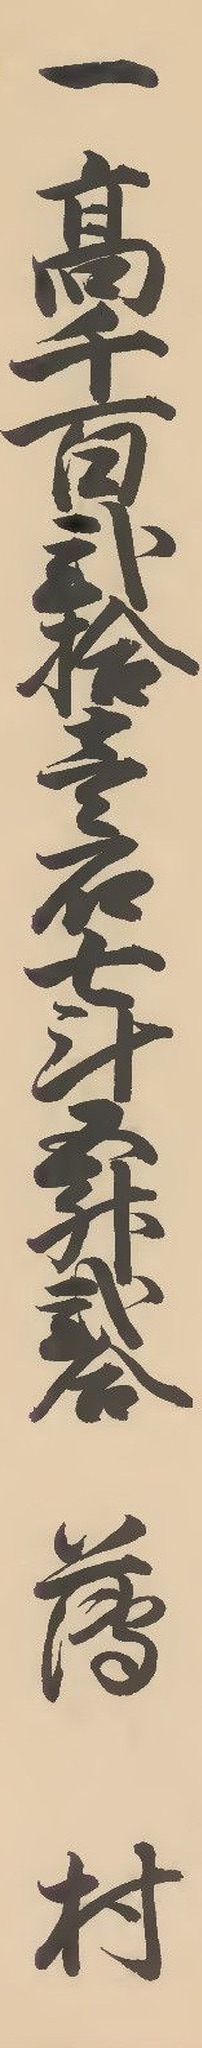一高千百弐拾壱石七斗五升弐合薄村

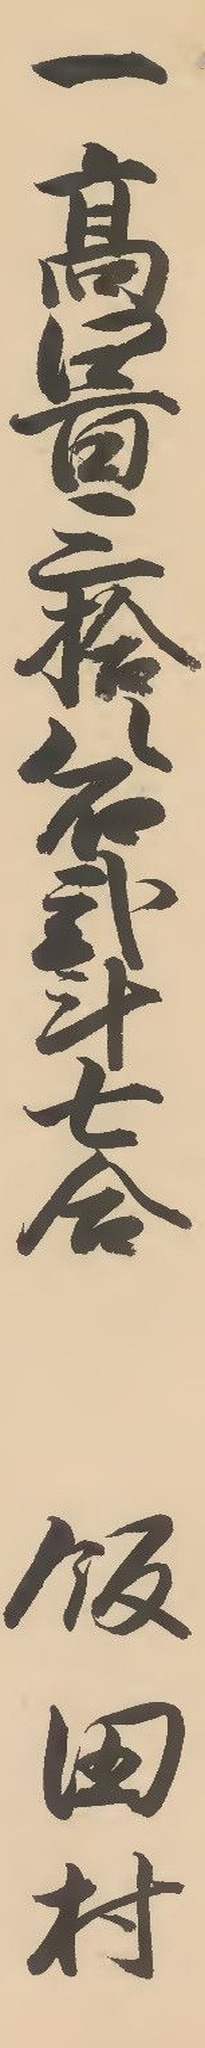一高四百三拾八石弐斗七合飯田村
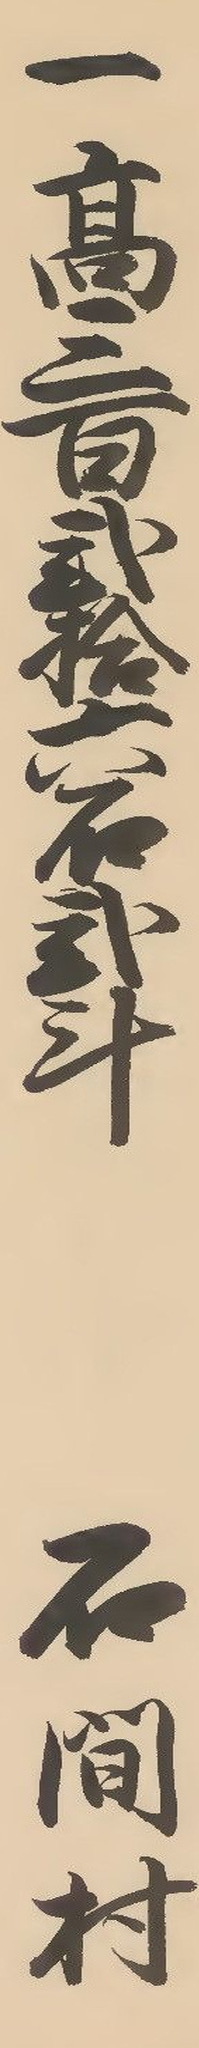一高三百弐拾六石弐斗石間村
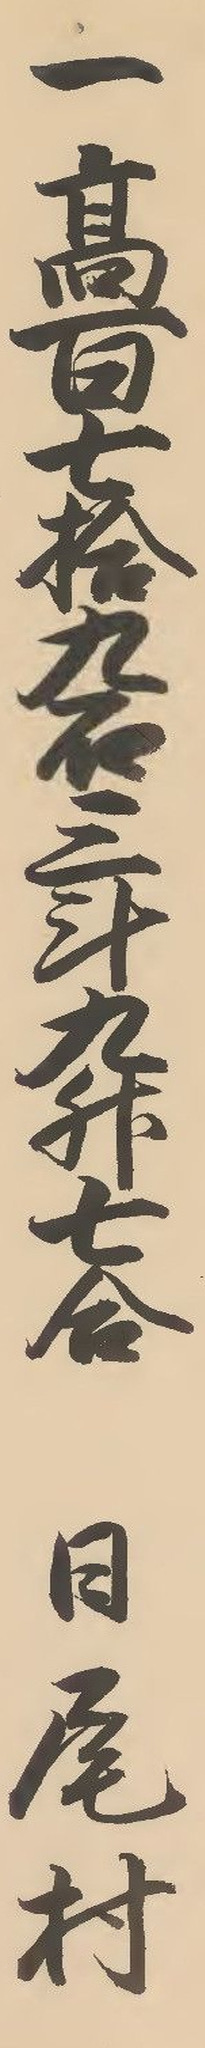一高百七拾九石三斗九升七合日尾村
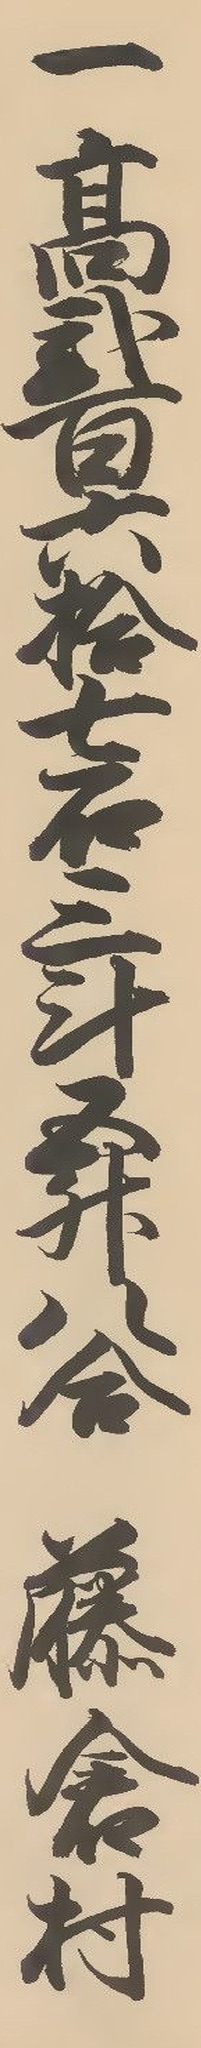一高弐百六拾七石三斗五升八合藤倉村
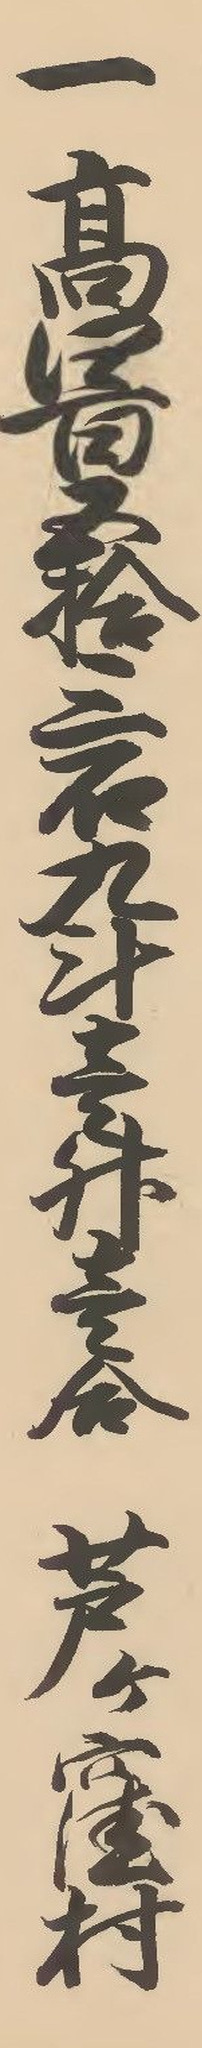一高四百五拾三石九斗壱升壱合芦ヶ窪村
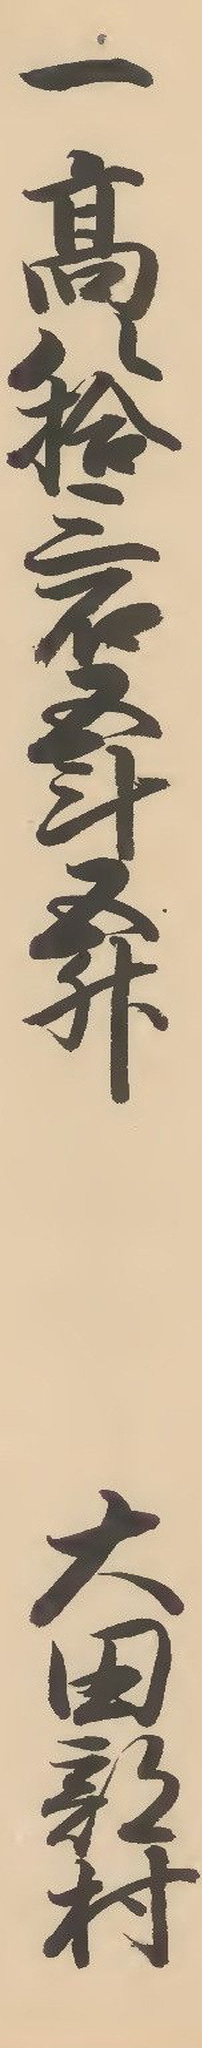一高八拾三石五斗五升大田部村
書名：武蔵国郷帳　上
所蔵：国立公文書館 National Archives of Japan
